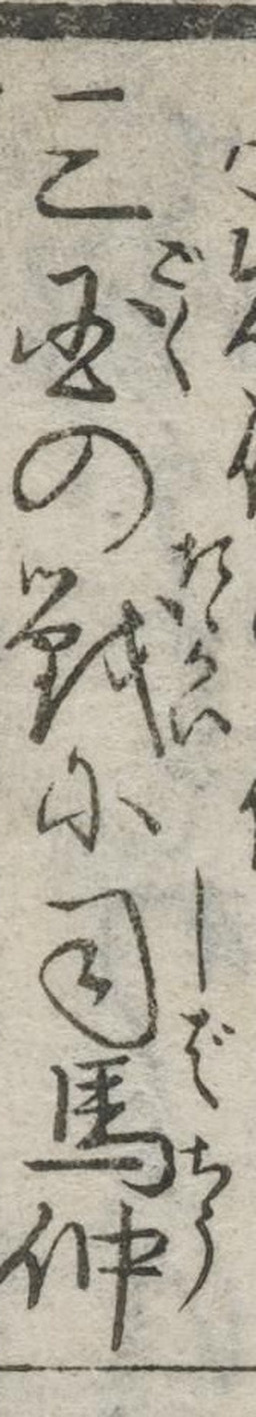三国の戦に司馬仲王

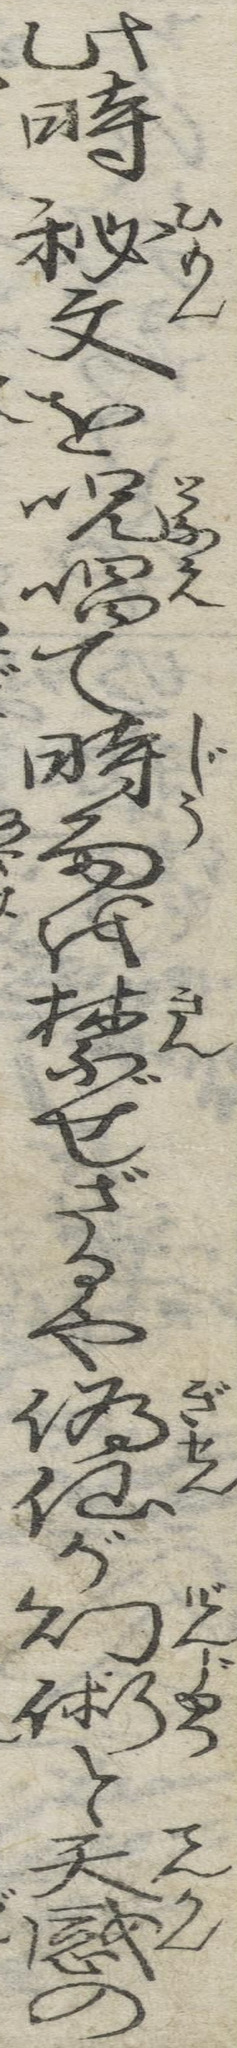此時秘文を呪唱て時雨を禁ぜざるや偽仙が幻術と天感の
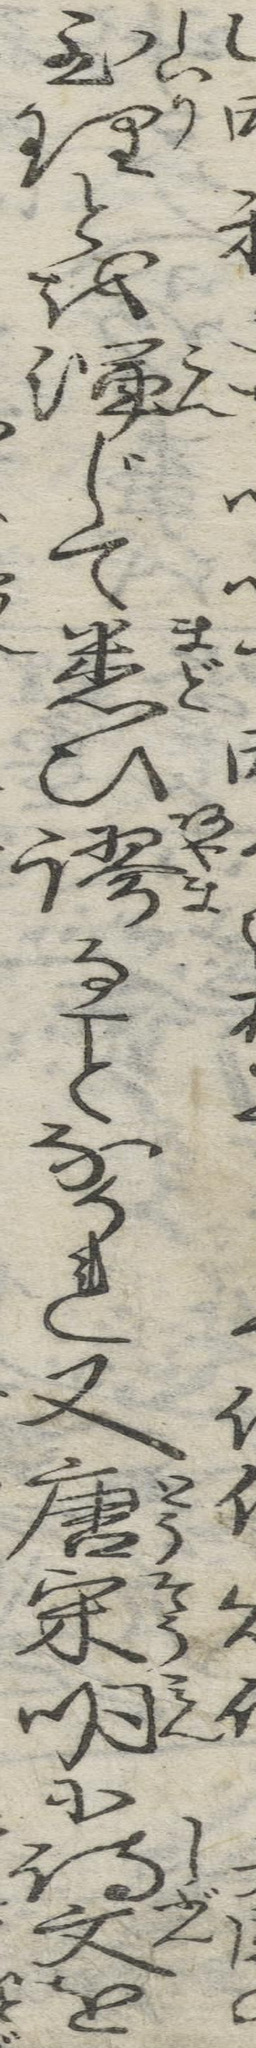至理とを渾じて迷ひ繆ることなかれ又唐宋明に詩文を
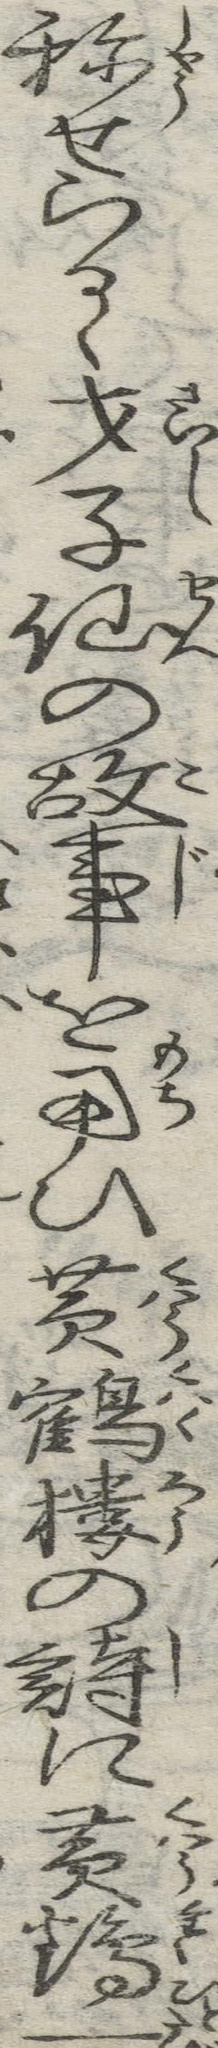称せらるゝ才子仙の故事を用ひ黄鶴樓の詩に黄鶴一
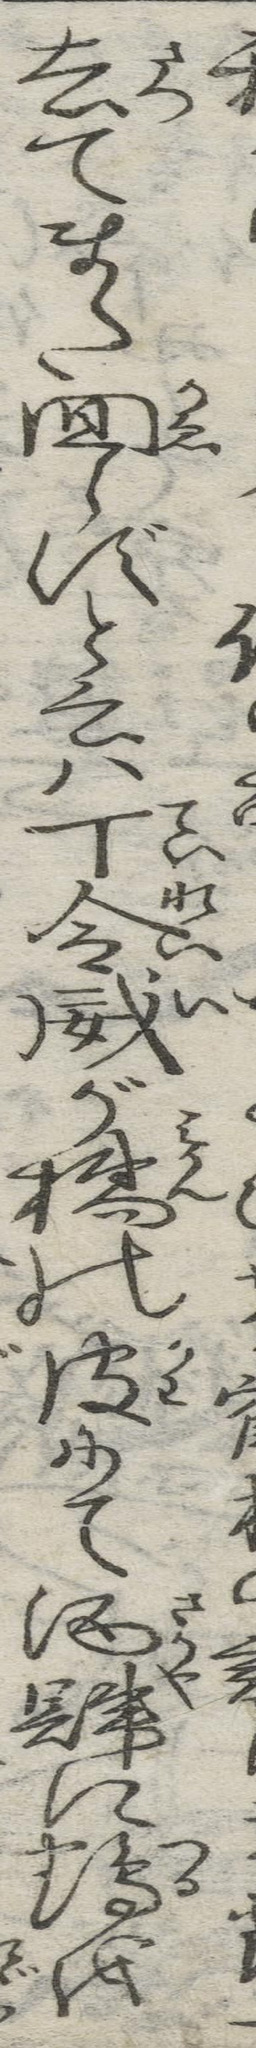去てまた回らずと云は丁令威が橘の皮にて酒肆に鶴を
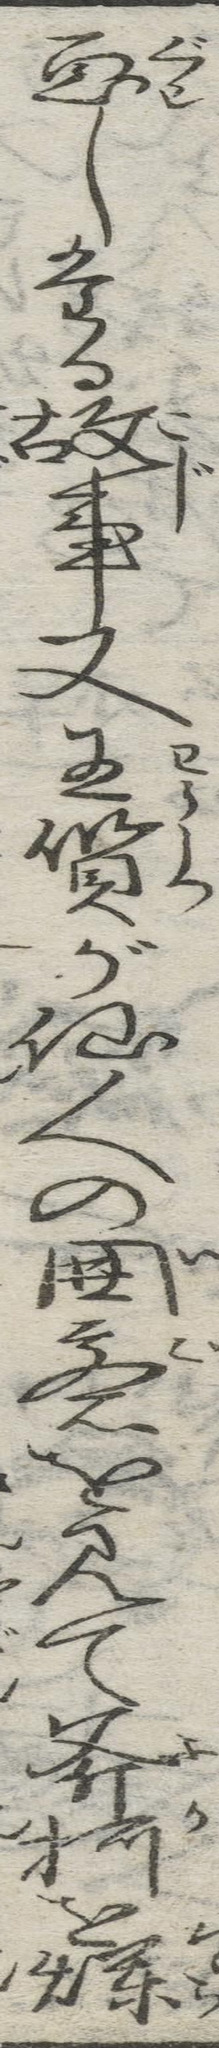画したる故事又王質が仙人の囲碁を見て斧柯を爛
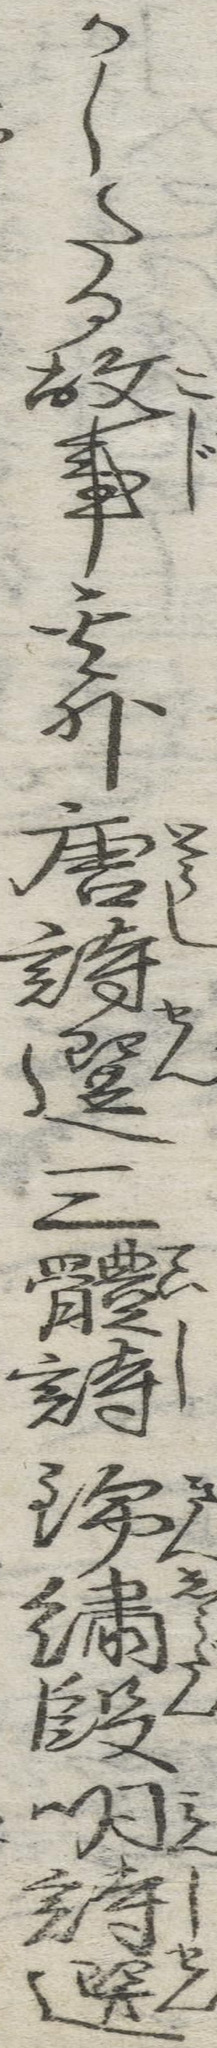かしたる故事其外唐詩選三體詩錦繍段明詩選
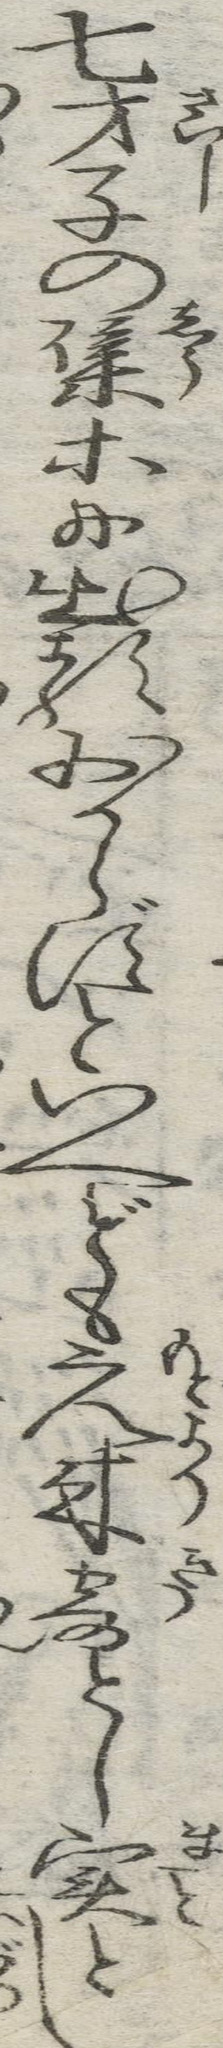七才子の集等に出る少からずといへども元来奇とし実とし
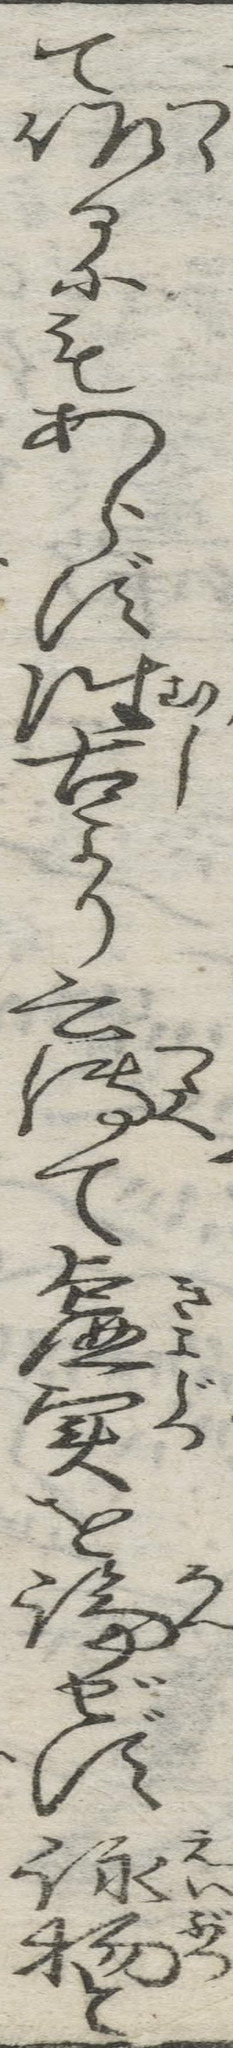て作るにはあらず往古より云伝て虚実を論ぜず詠物と
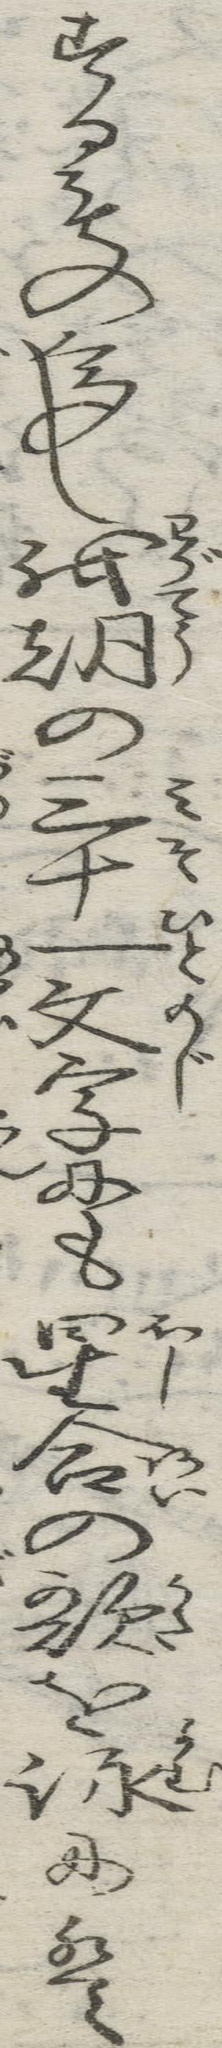するもの多し我朝の三十一文字にも星合の歌を詠には
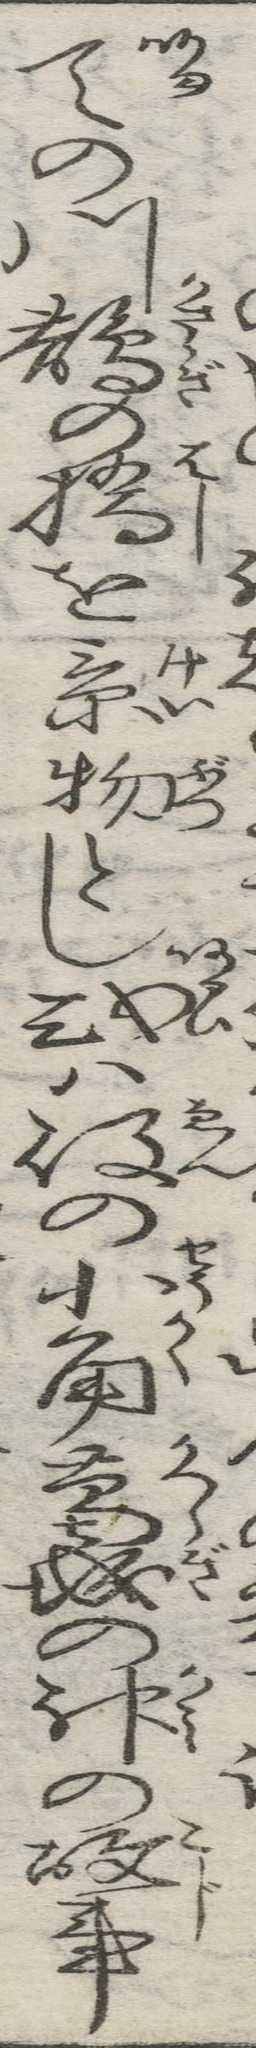天の川鵲の橋を京物とし或は役の小角葛城の神の故事
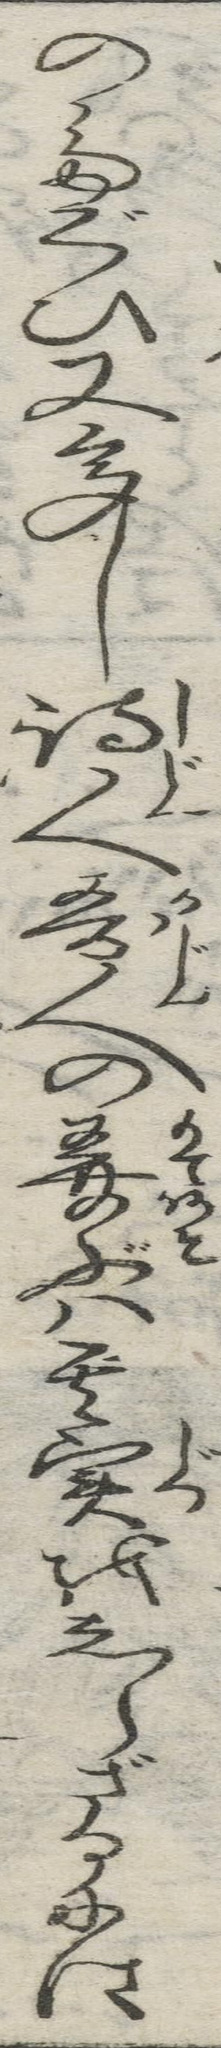のたぐひ又多し詩人歌人の弄ぶは其実をしらざるには
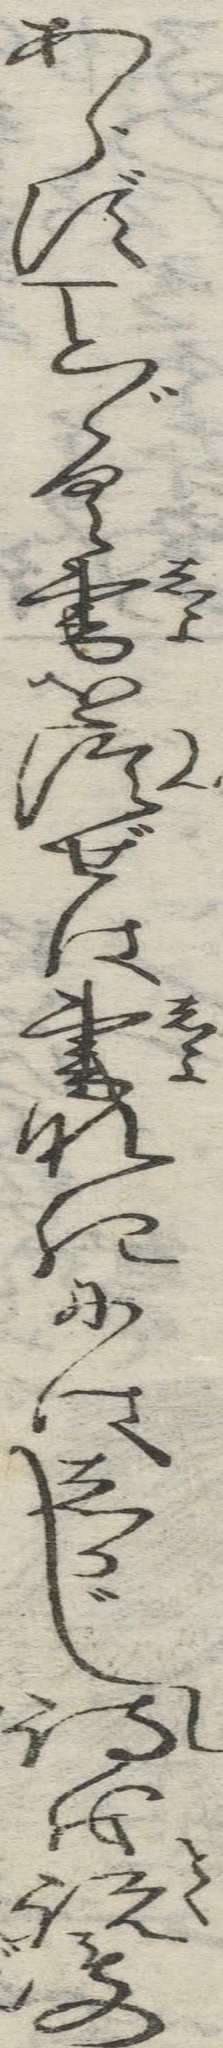あらずこと〴〵なし書を信ぜは書なきにしかじ詩を説もの
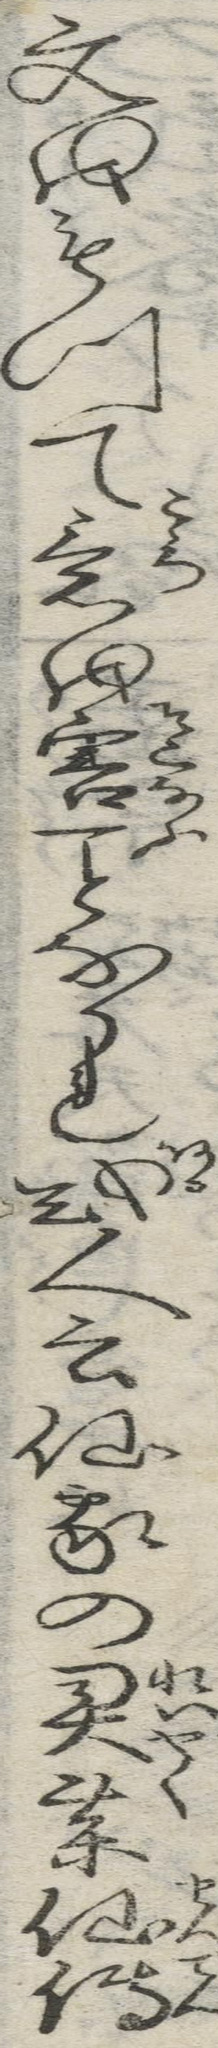文をもつて意を害ことなかれ或人云仙家の㚑薬仙伝
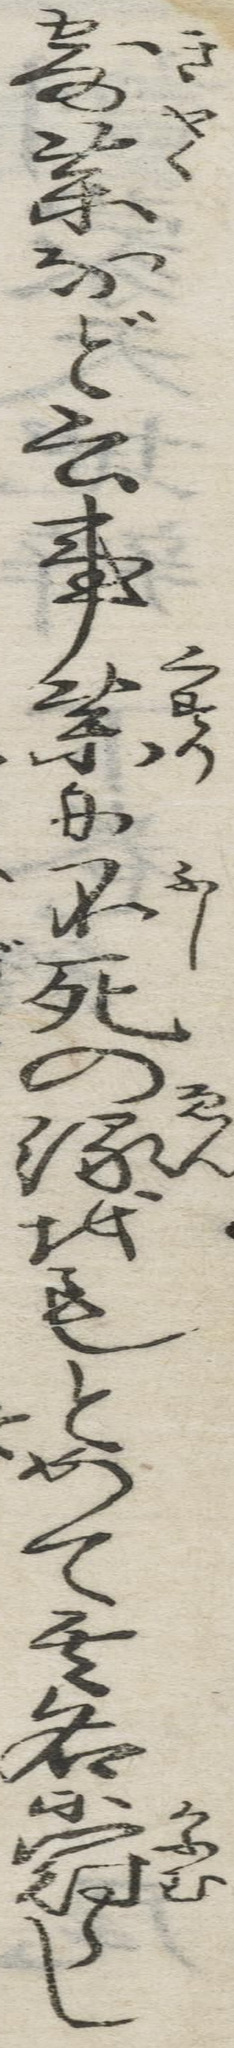奇薬など云事薬に不死の縁をもとめて其名に可何らし
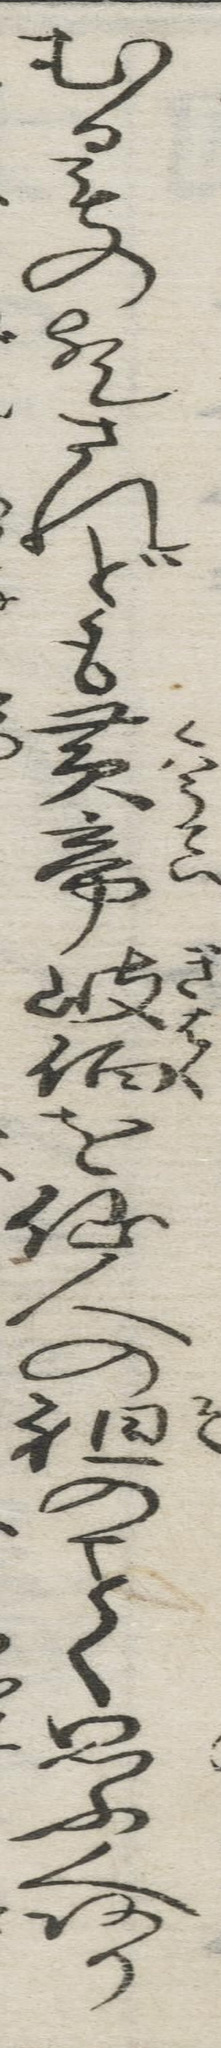むるもの有されども黄帝岐伯を仙人の祖のことく思ふ人あり
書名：訓蒙天地辨　人
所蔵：東京大学地震研究所図書室 Earthquake Research Institute Library, The University of Tokyo, JAPAN
